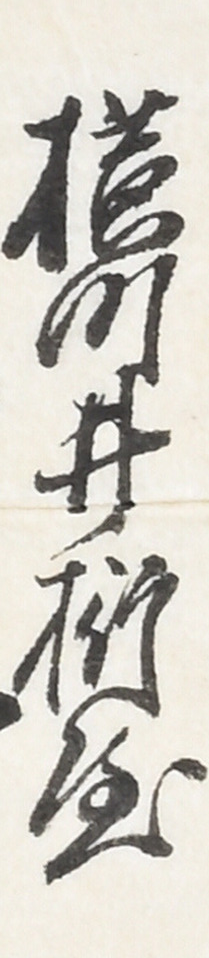横町井桁屋
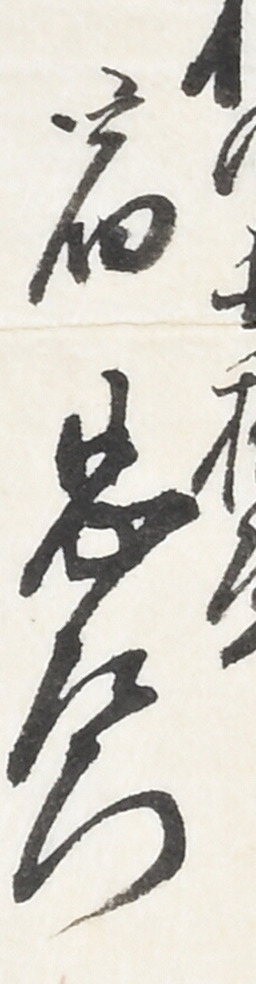宿忠左衛門
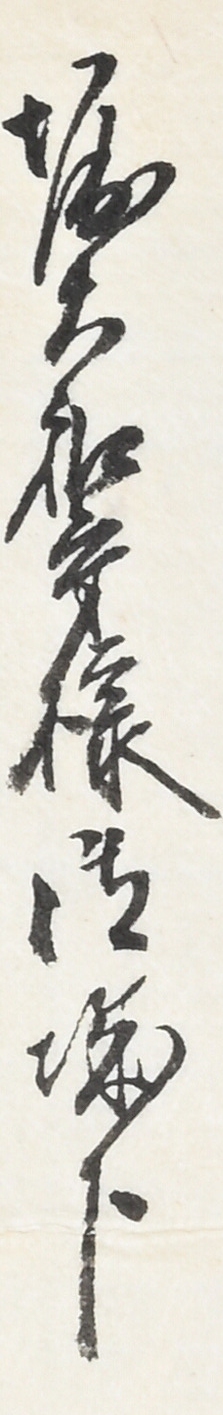堀大和守様御城下
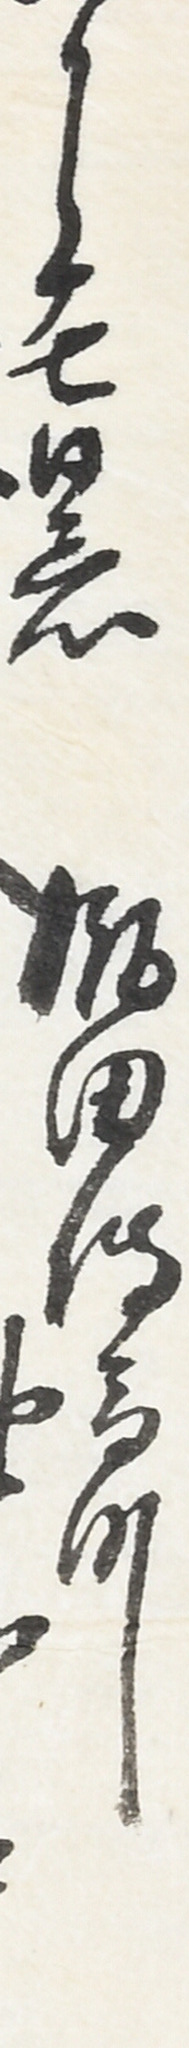四月十七日着飯田伝馬町
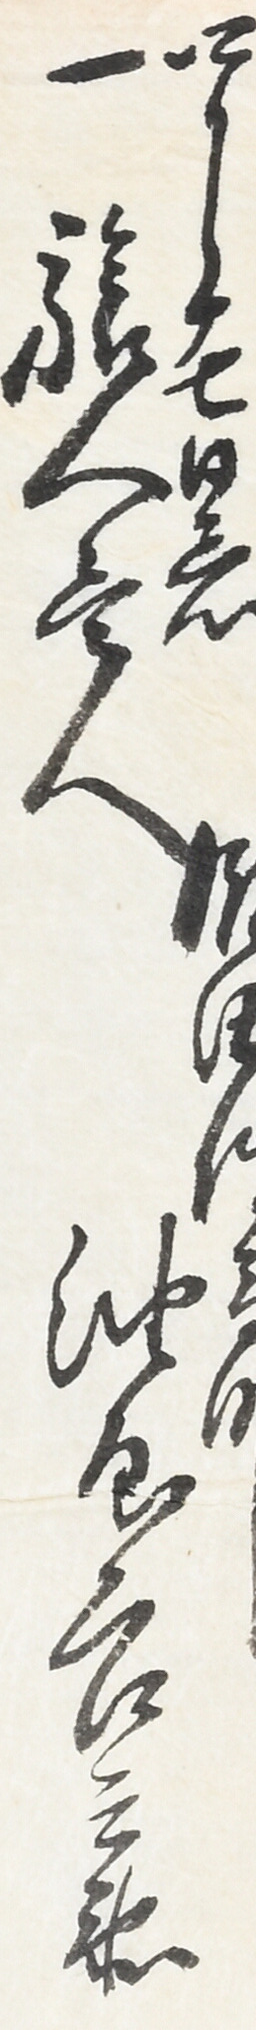一旅人壱人油屋吉兵衛
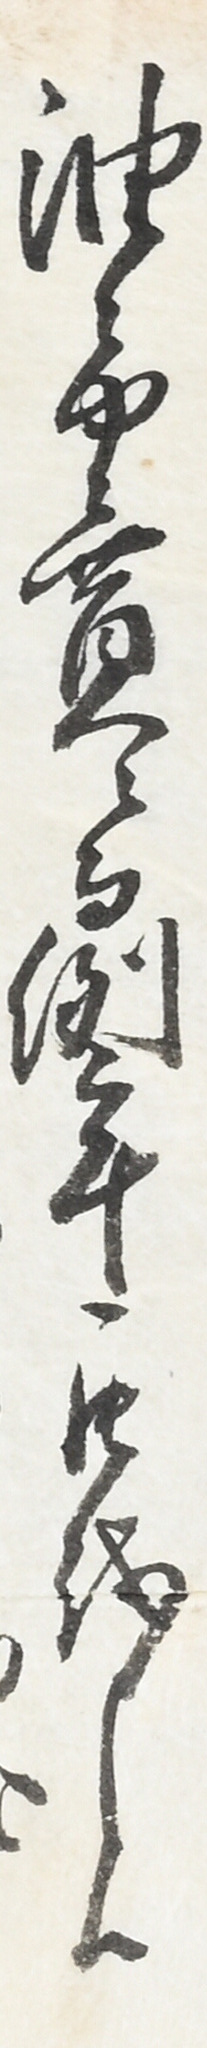油商売ニ而例年罷越申候
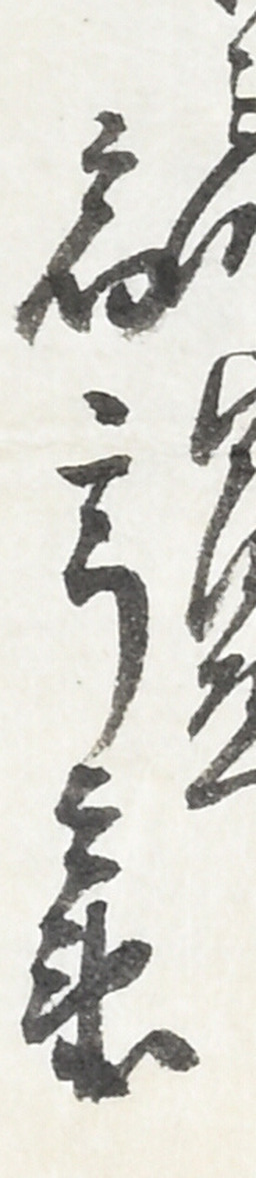宿宇兵衛
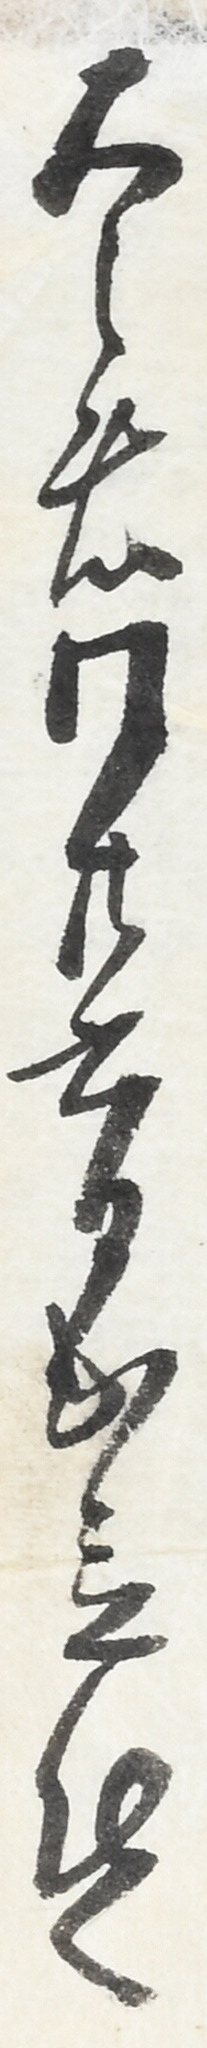右之者同廿六日出立仕候

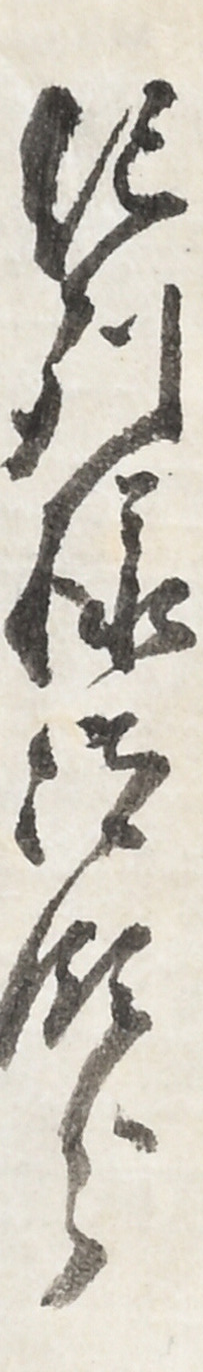紀州様御領分
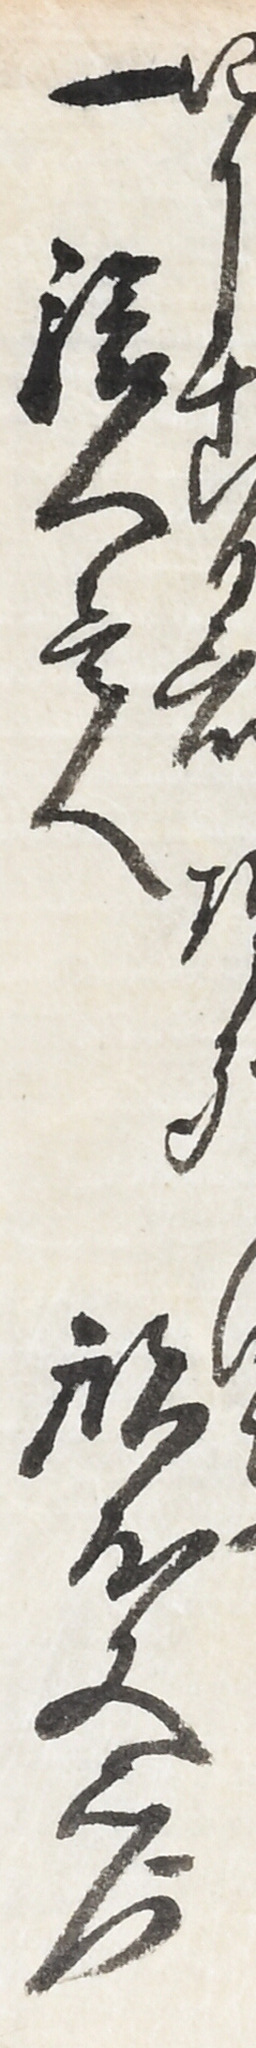一旅人壱人形屋又右衛門
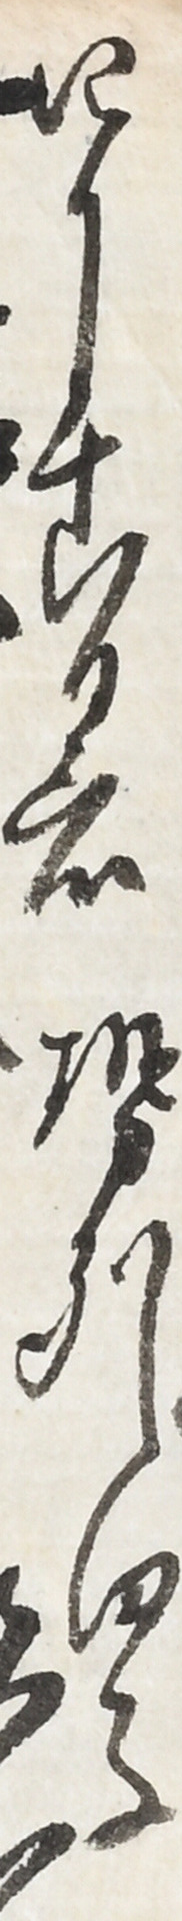四月十八日着勢州白子
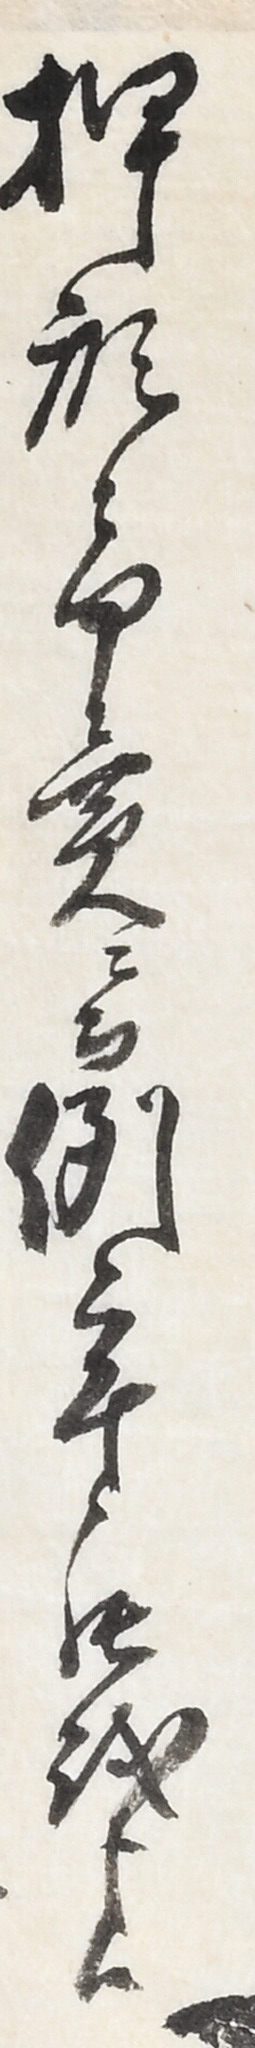押形商売ニ而例年罷越申候
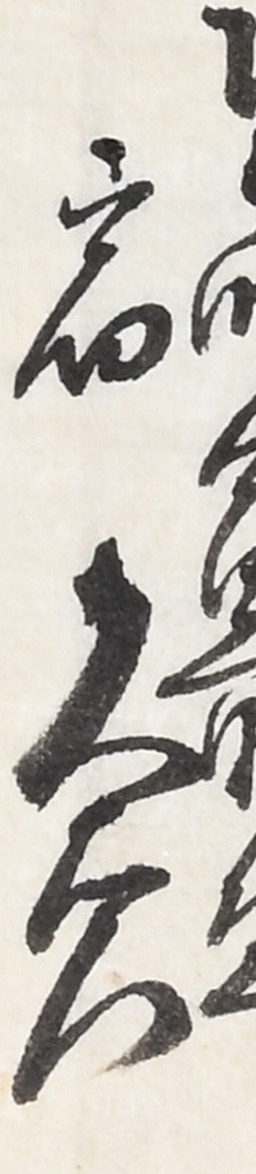宿久右衛門
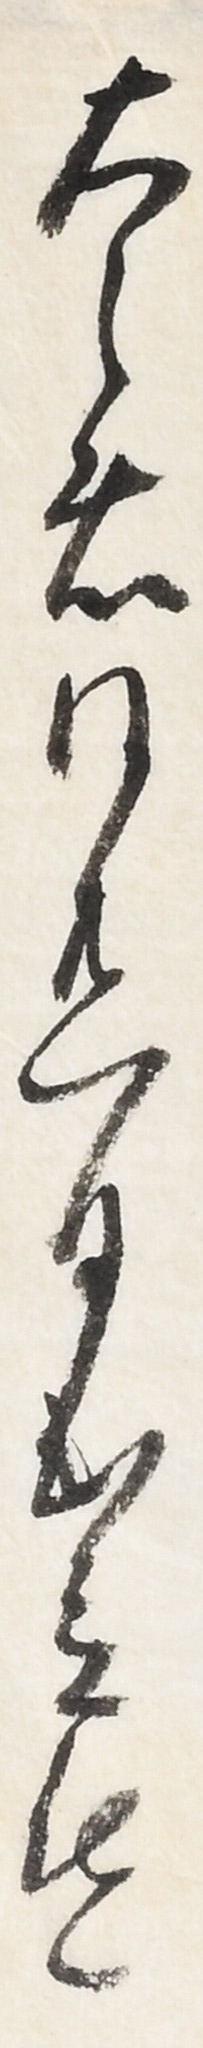右之者同廿一日出立仕候
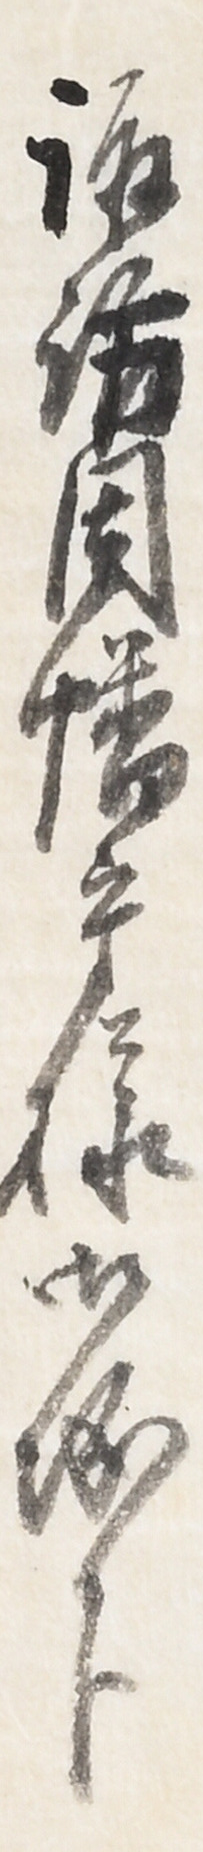諏訪因幡守様御城下
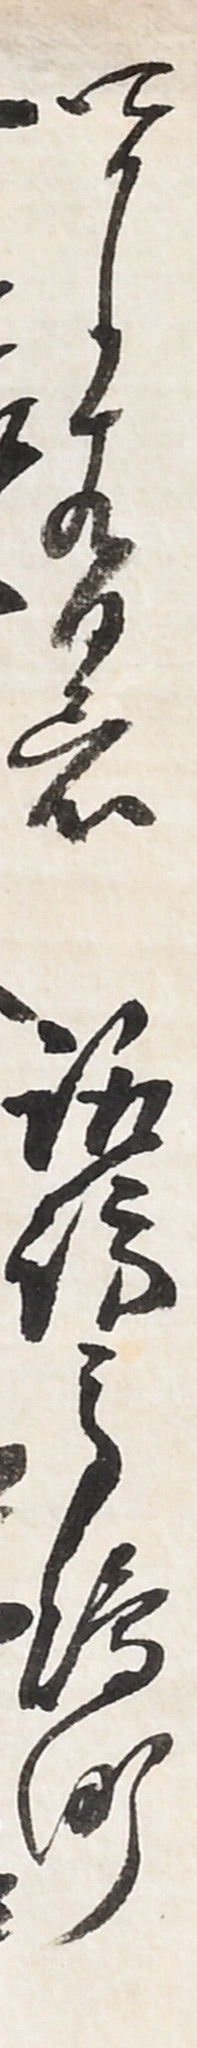四月十九日着諏訪高嶋町
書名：旅人泊控帳
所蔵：伊那市立高遠町図書館・合同会社AMANE
